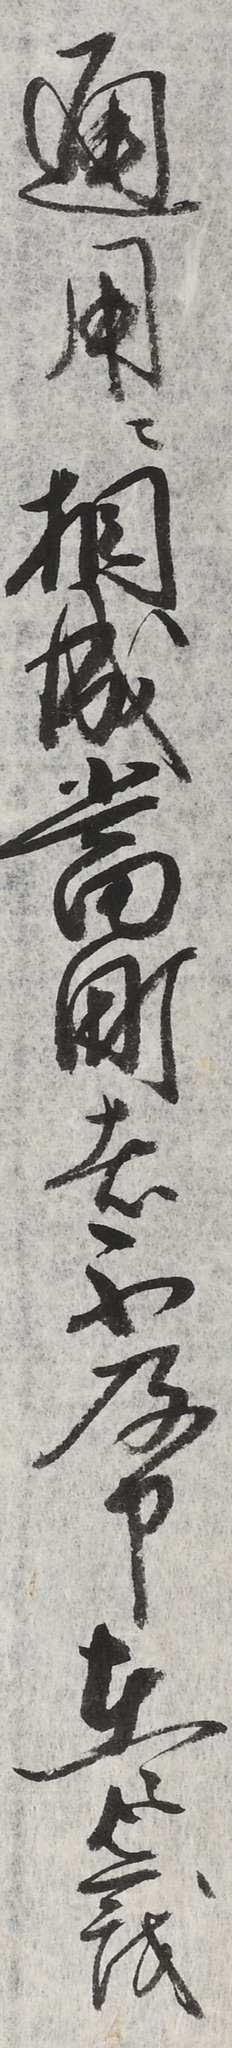通用ニ相成当町は不及申在々迄も
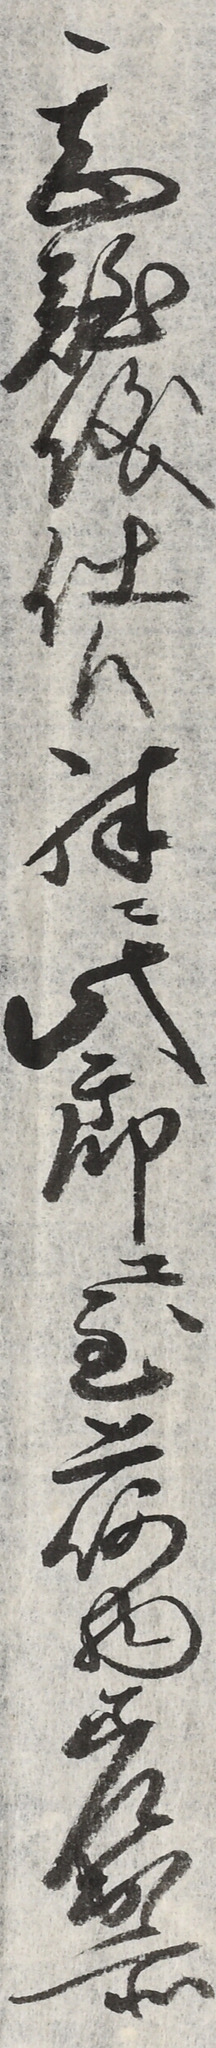甚難儀仕候殊ニ此節ニ至荷物差出候所
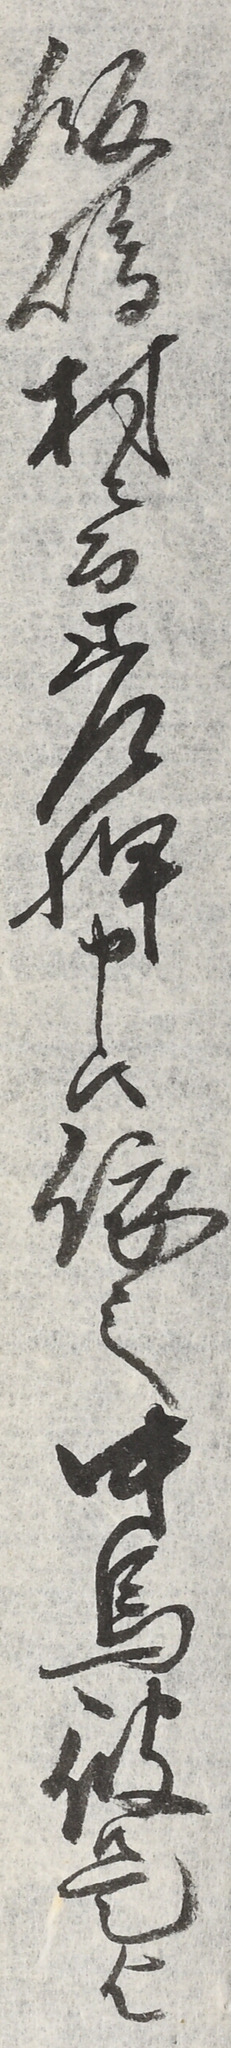飯嶋村ニ而差押申候依之中馬彼是と
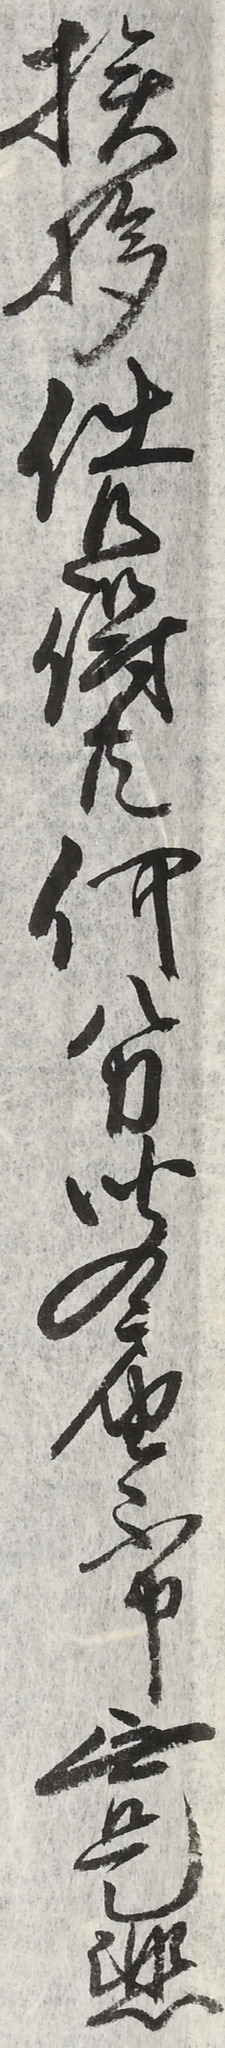挨拶仕候得共何分聞届不申無是悲
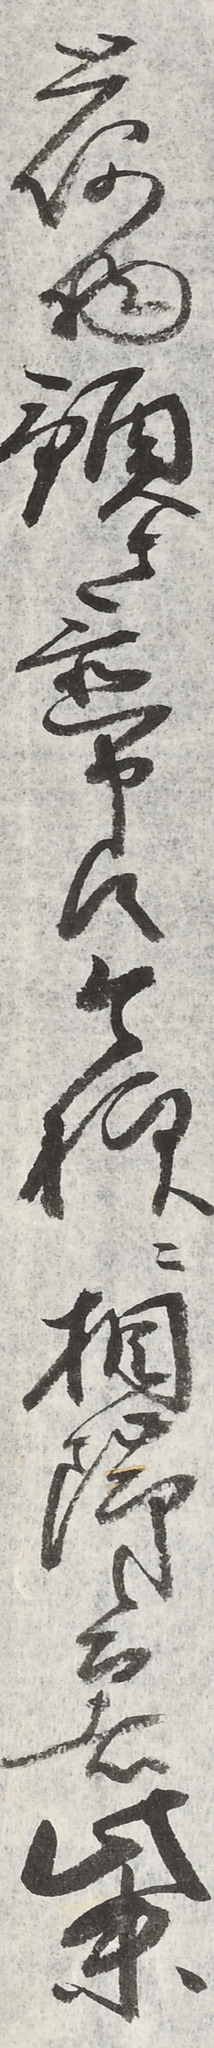荷物預ヶ置申候ヶ様ニ相滞候而は此未
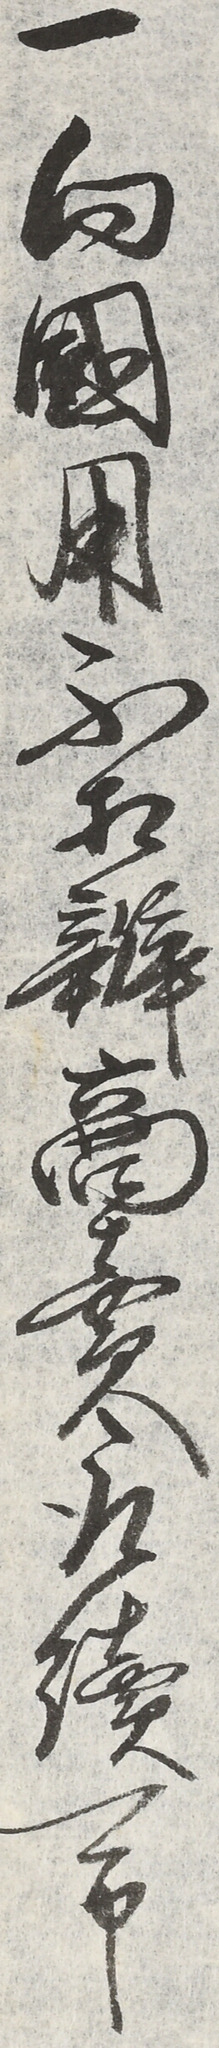一向国用不相弁商売取続可申
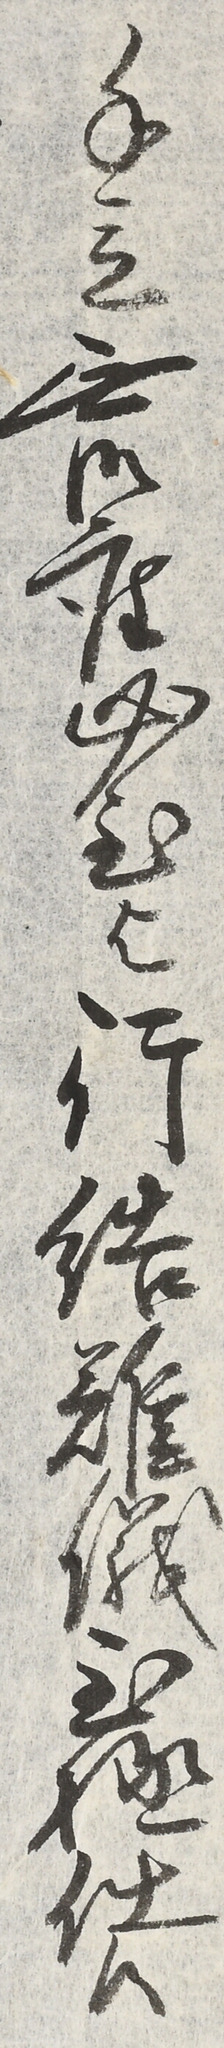手立無御座必至と行詰難儀至極仕候
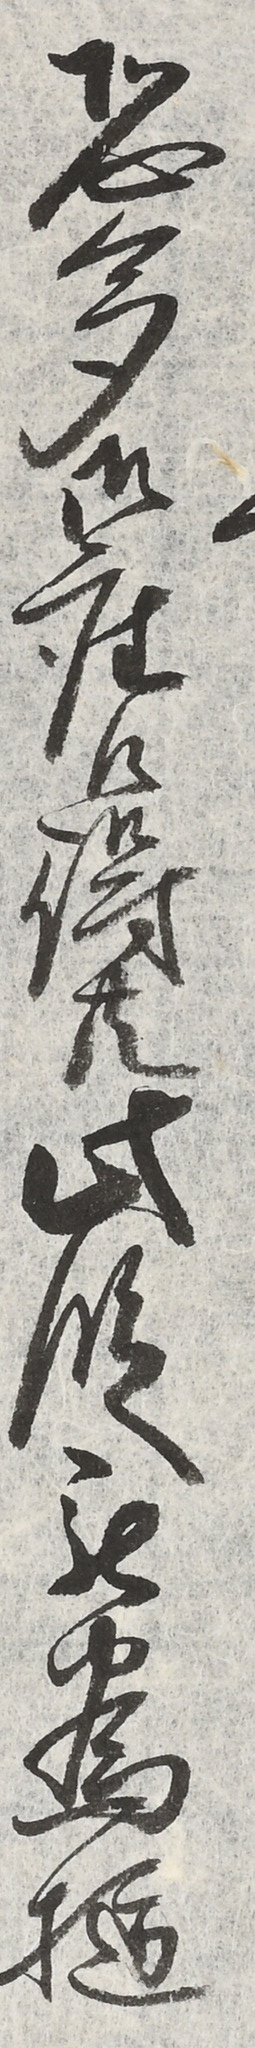恐多御座候得共此段被為遊
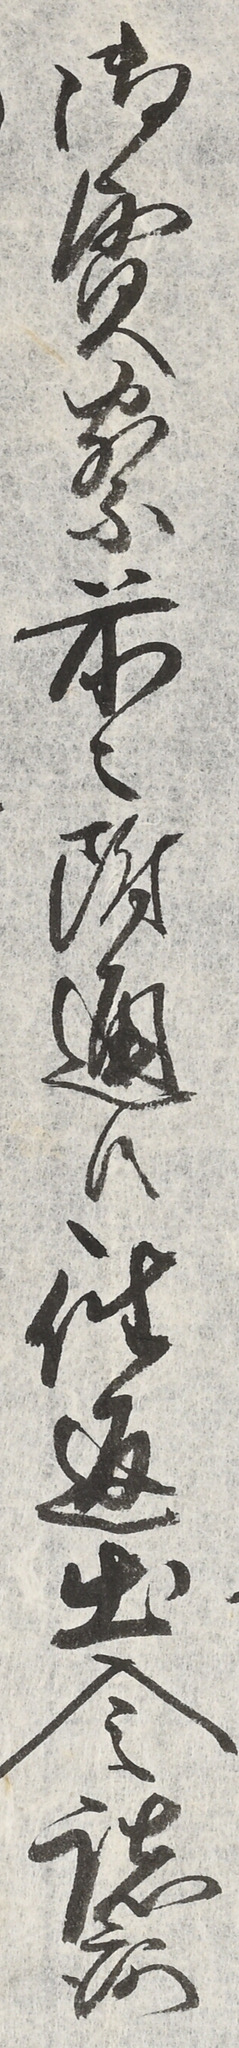御賢察前々附通候往返出入之諸荷
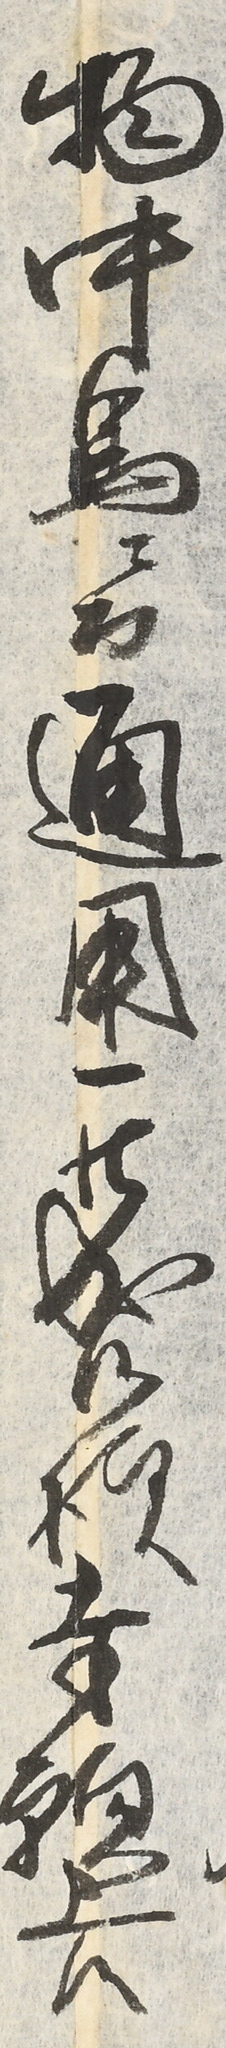物中馬ニ而通用被成候様奉願上候
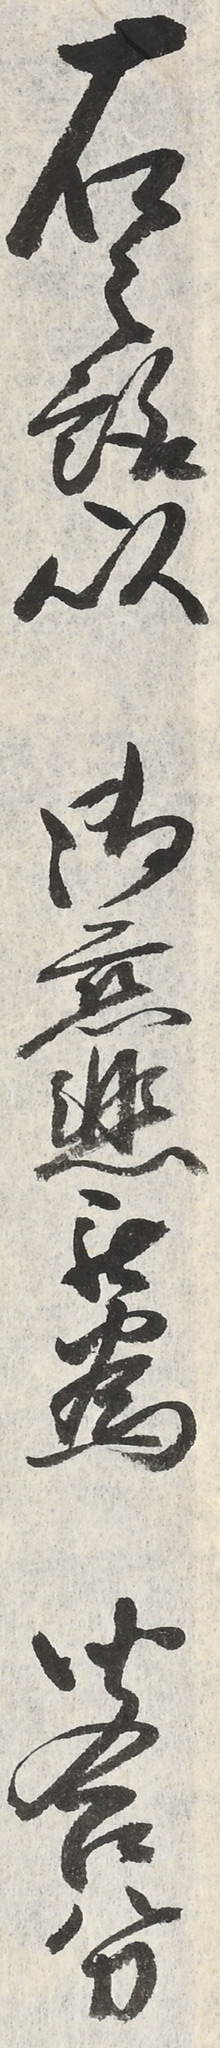右之趣以御慈悲被為聞召分
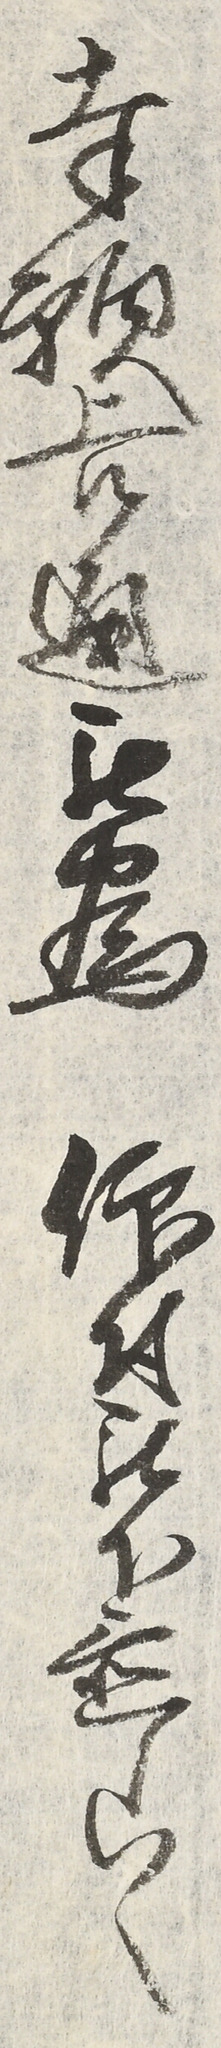奉願上候通被為仰付被下置候ハヽ
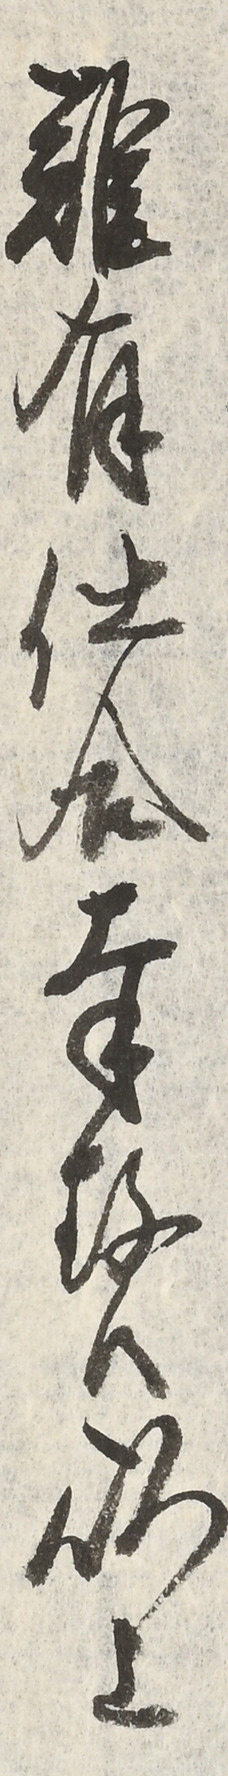難有仕合奉存候以上
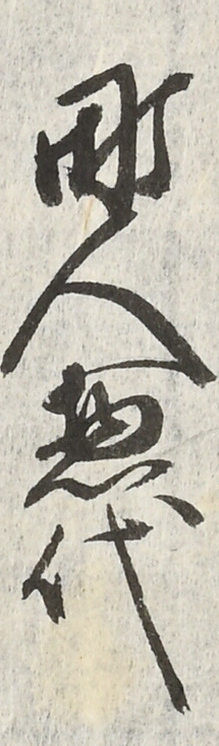町人惣代
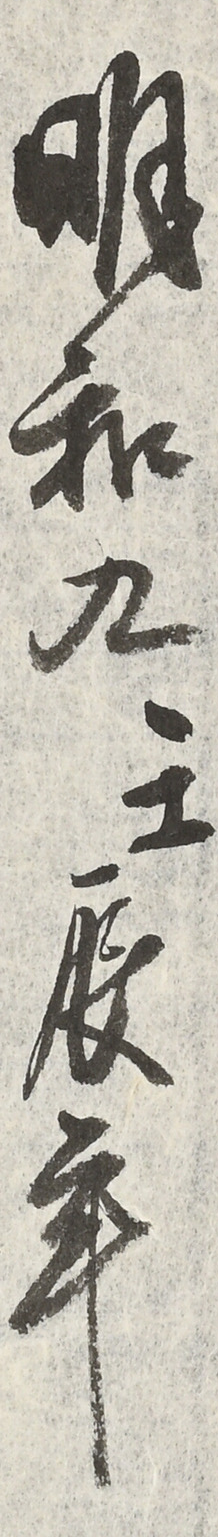明和九壬辰年
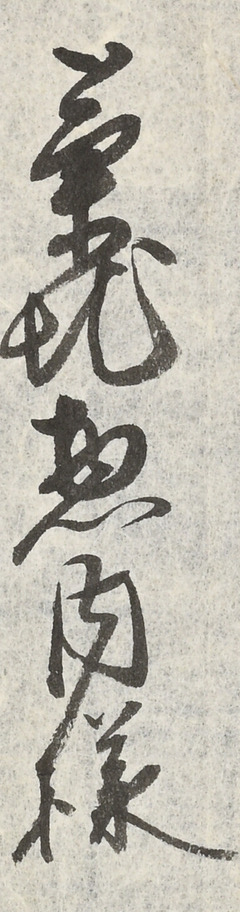菊地惣内様
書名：乍恐以書付御訴訟申上候御事
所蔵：伊那市立高遠町図書館・合同会社AMANE
